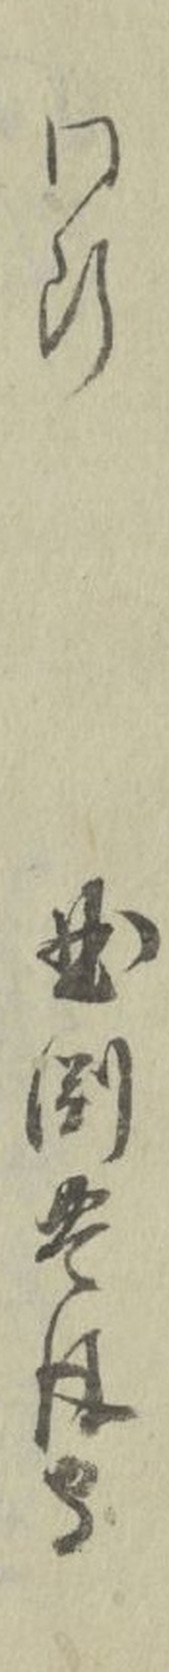同断曲淵豊後守
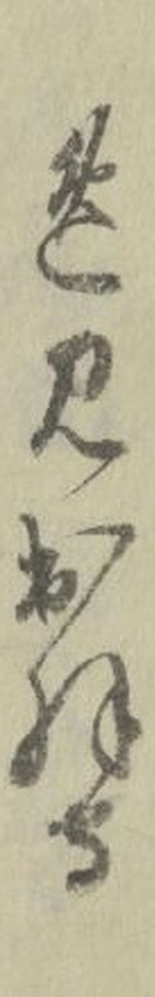同断逸見出羽守

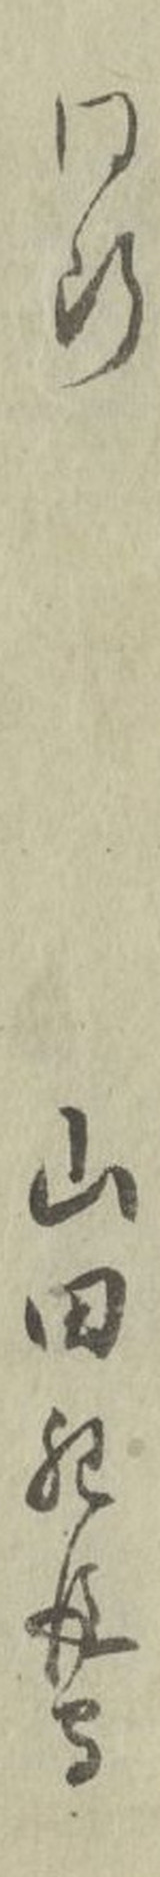同断山田肥後守
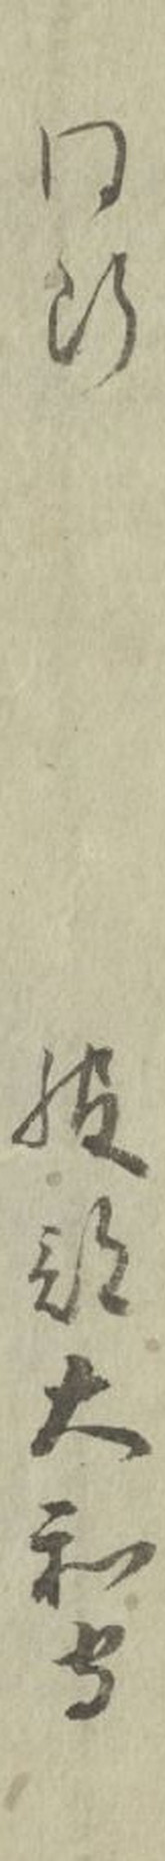同断服部大和守
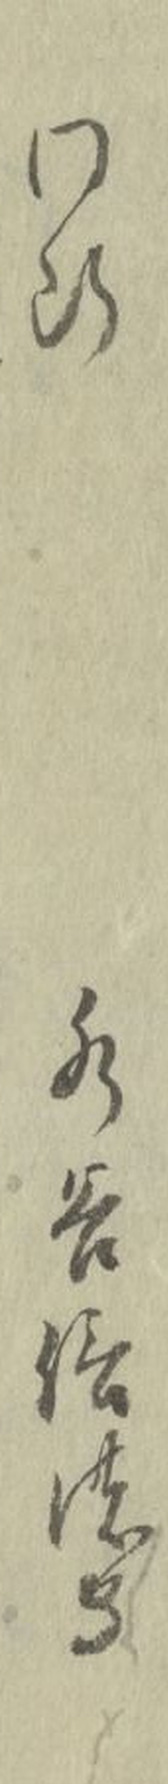同断水谷信濃守
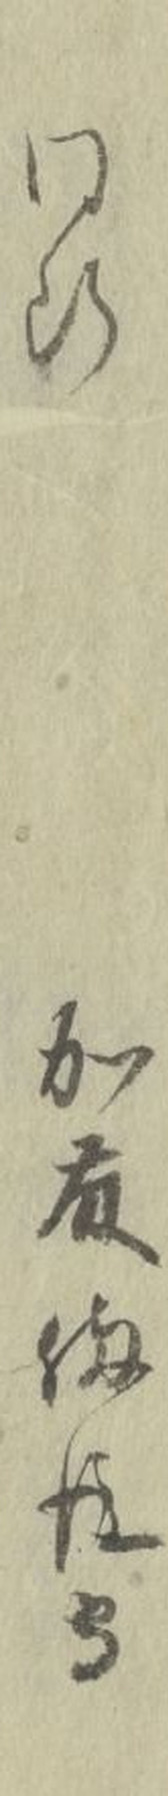同断加藤備後守
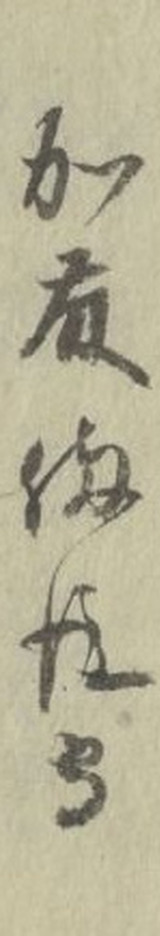同断加藤備後守
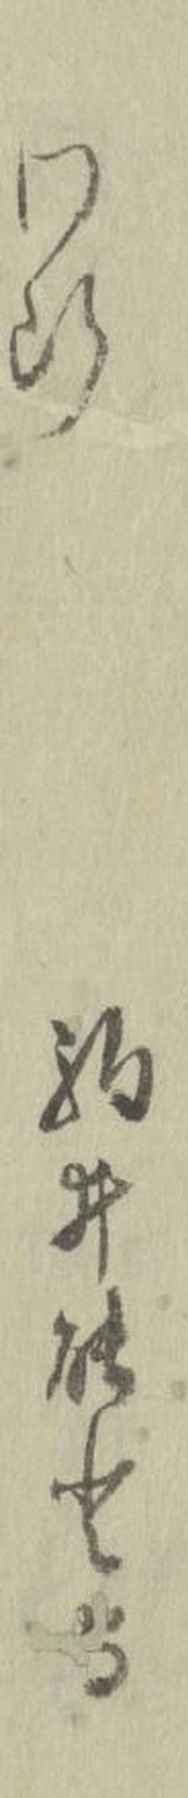同断駒井能登守
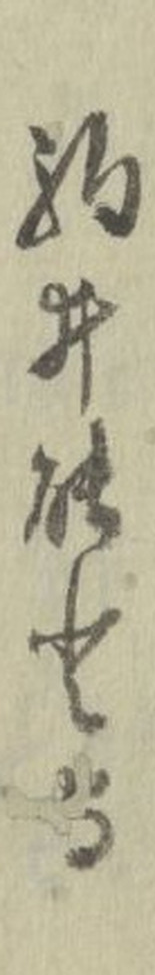同断駒井能登守
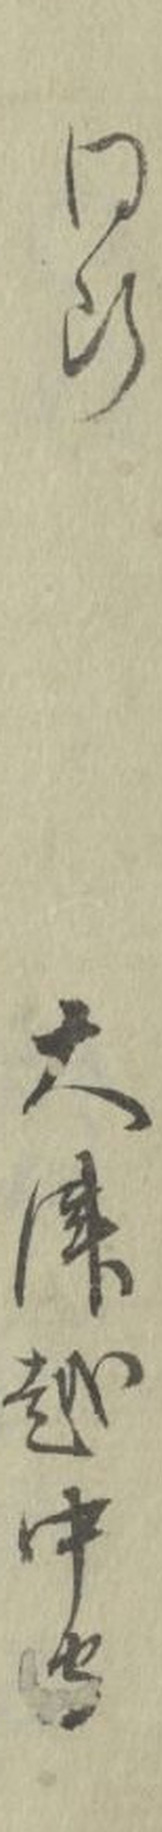同断大津越中守
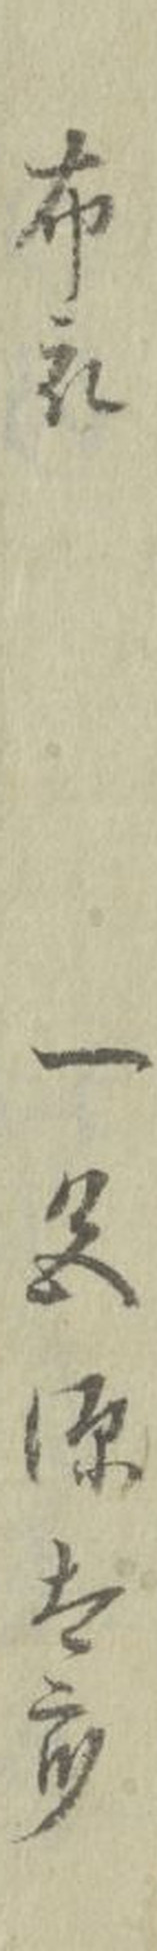布衣一色源太郎
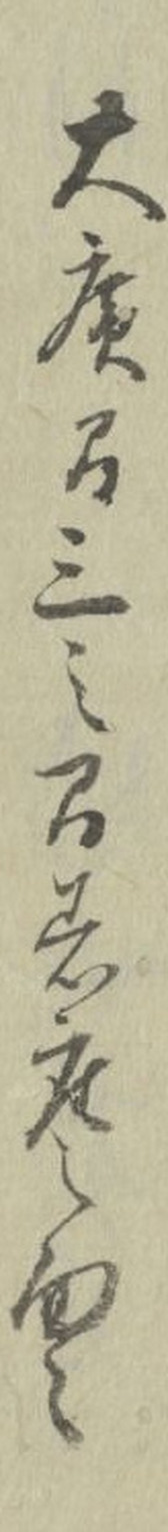大広間三之間着座之面々
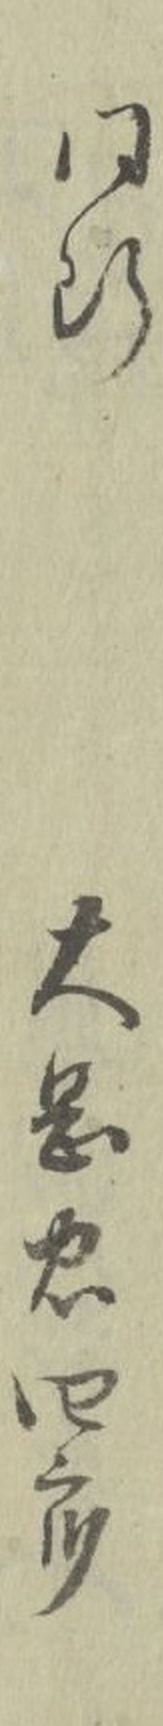同断大岡忠四郎

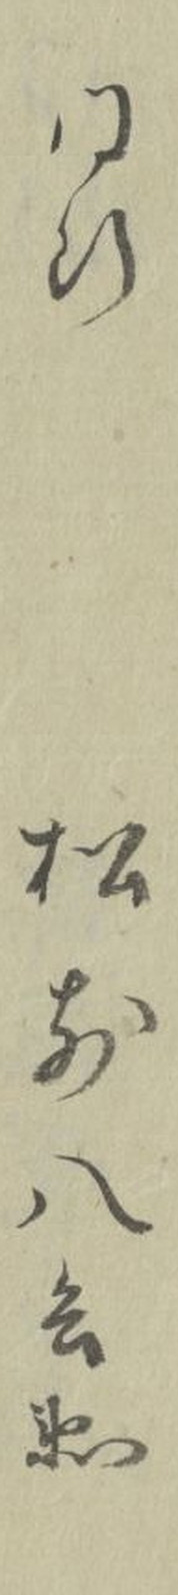同断松前八兵衛

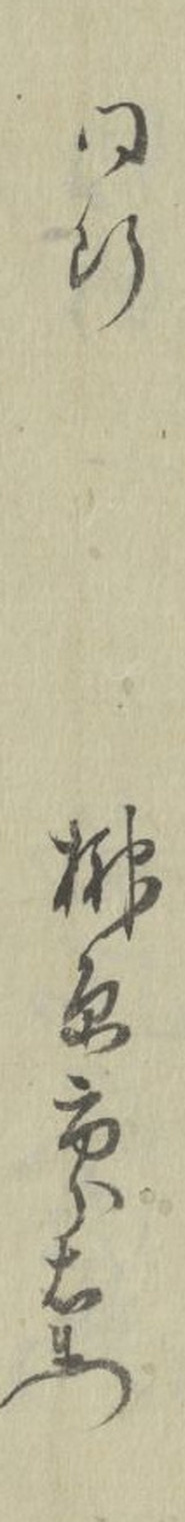同断柳原市郎右衛門
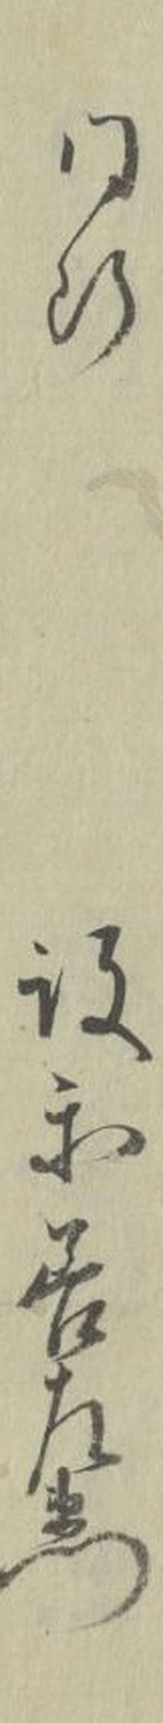同断設樂善左衛門
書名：琉球来朝記 自八至十四終
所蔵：University of the Ryukyus Library
